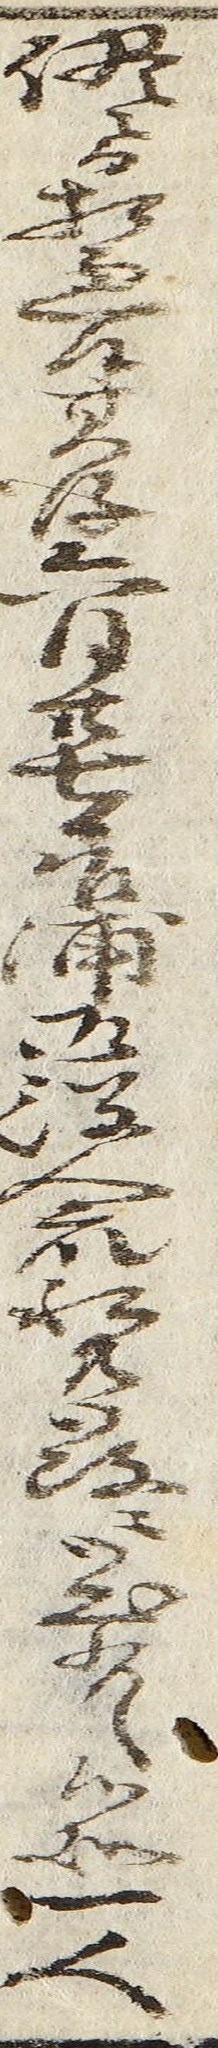侭に而打過候其後六月廿七日乍浦御役人衆私共御改に御出有之候処一人
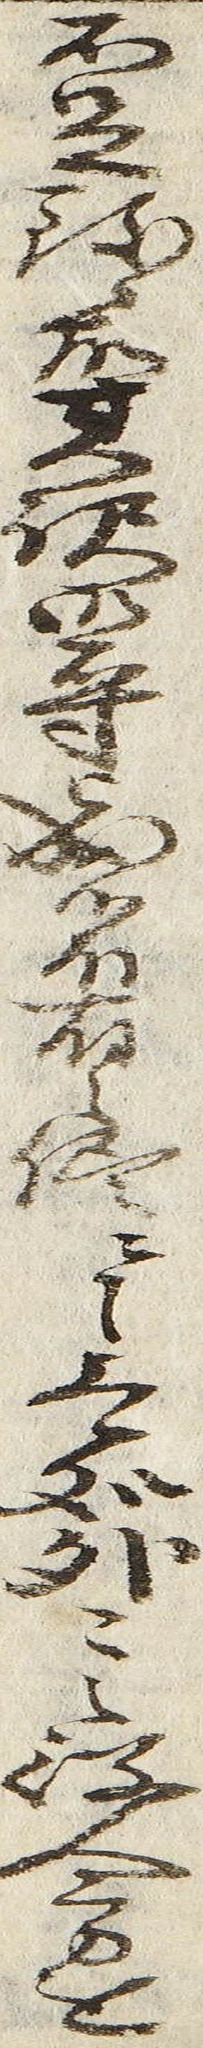不足致候故其訳御尋被成候付有之侭に申上候処外々之役人方を
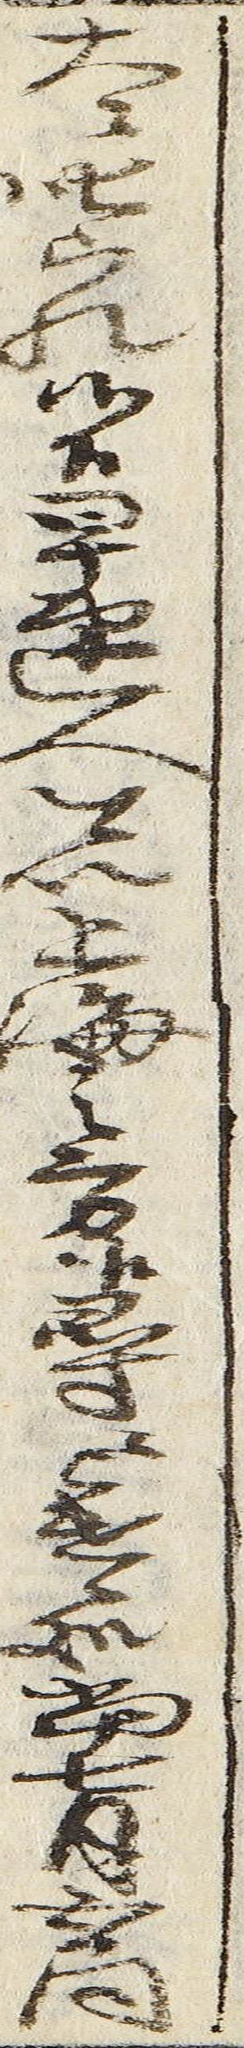大に叱られ候付早速人を以上海之方江尋に被遣候処当七月五日同
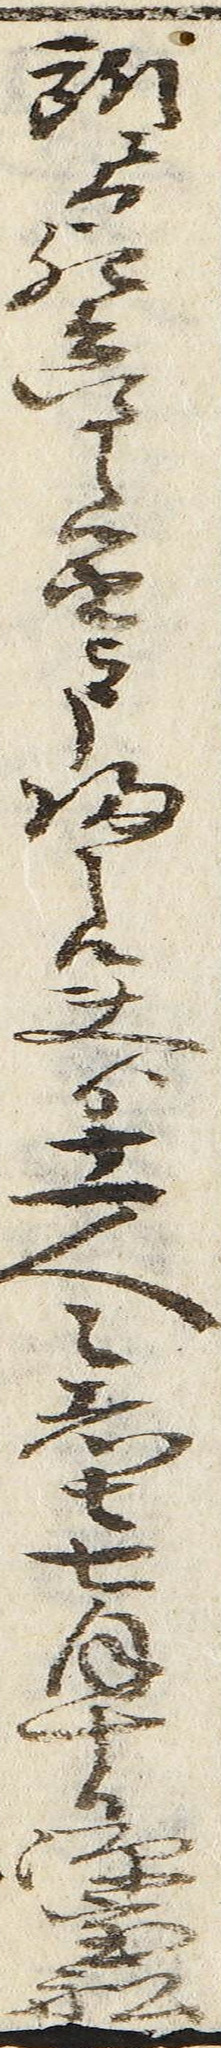所に而死去いたし候由被申帰申候夫ゟ十一人之者は七月十日源宝船
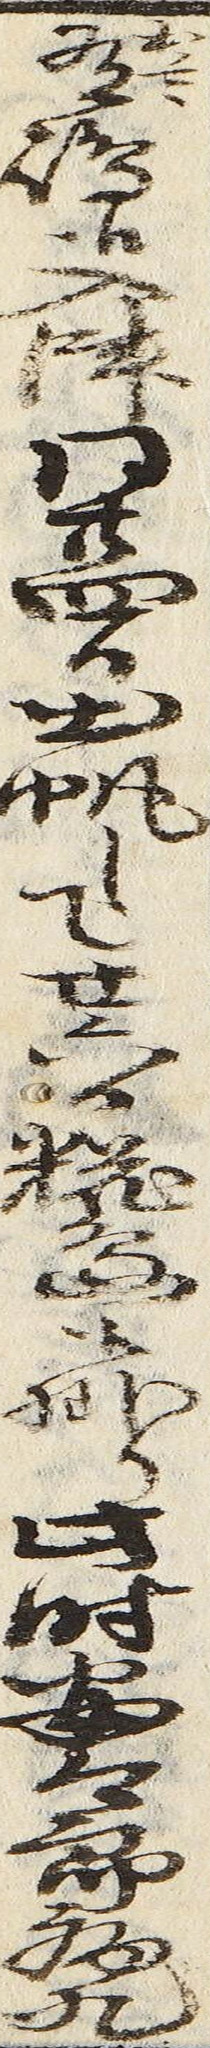有島江入津同廿四日出帆して廿六日糀辺江掛り此時安太郎病死
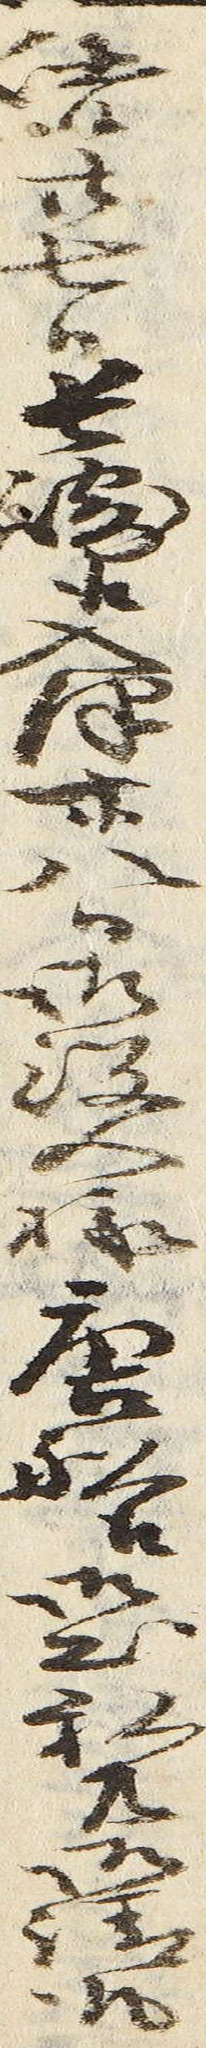仕候廿七日長崎江入津廿八日御役人様唐船江御出私共御請取
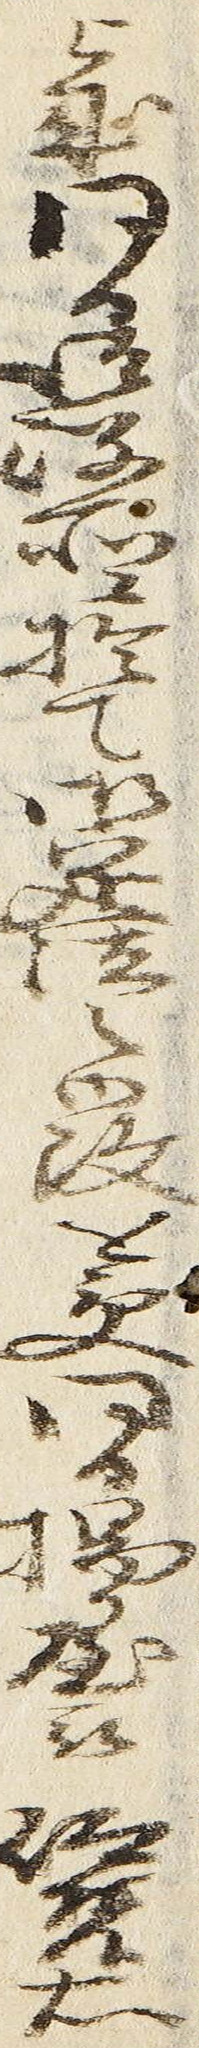被成同日御役所に於て御定法之御改を受同日揚り屋被仰付候右
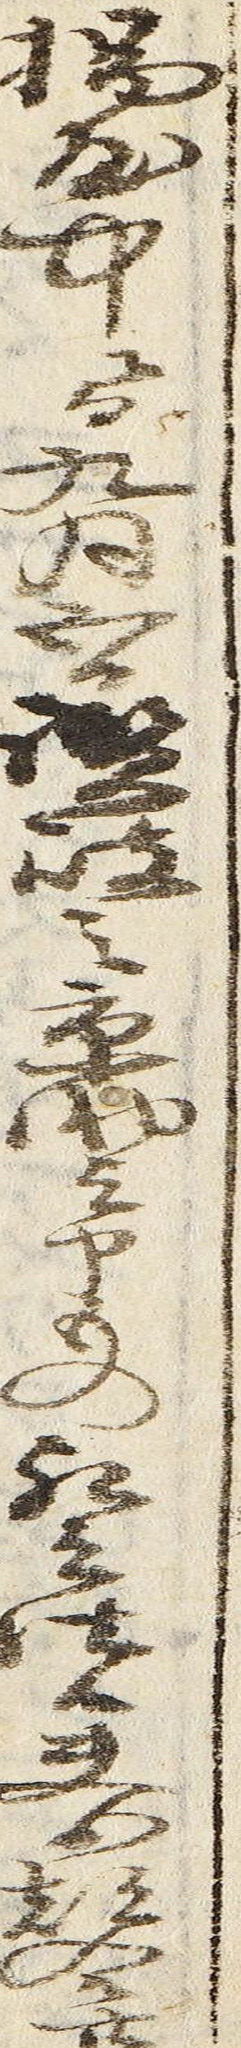揚屋中に而九月五日讃岐之京助と申もの死去仕候夫ゟ都合廿
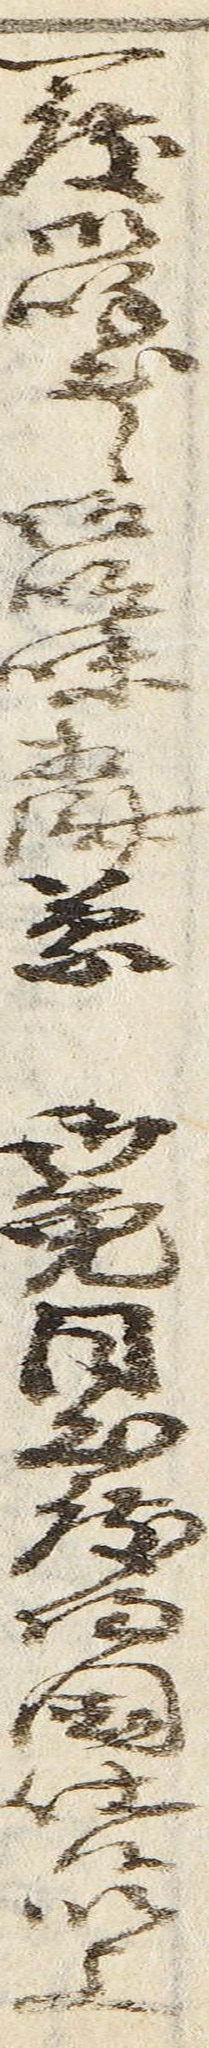一度御呼出し御吟味相済蒙御免目出度帰国仕候以上
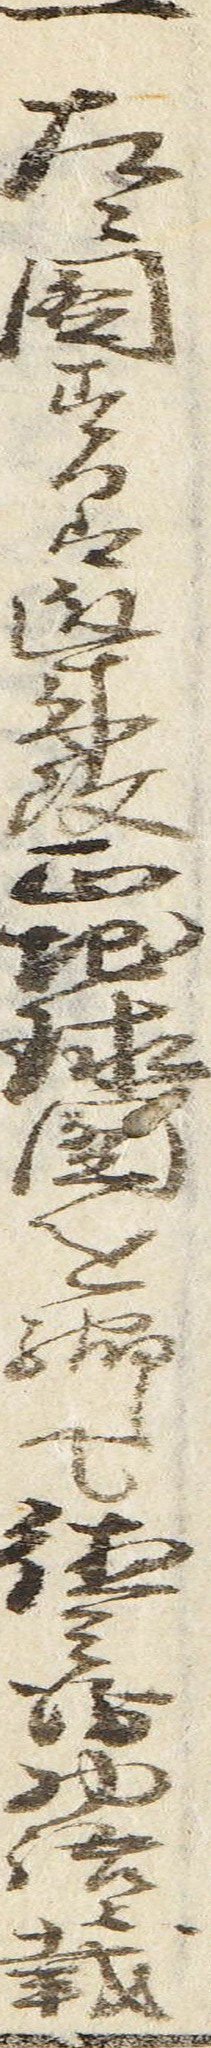一左に図するは近来改正地球図を縮して徳兵衛物語に載
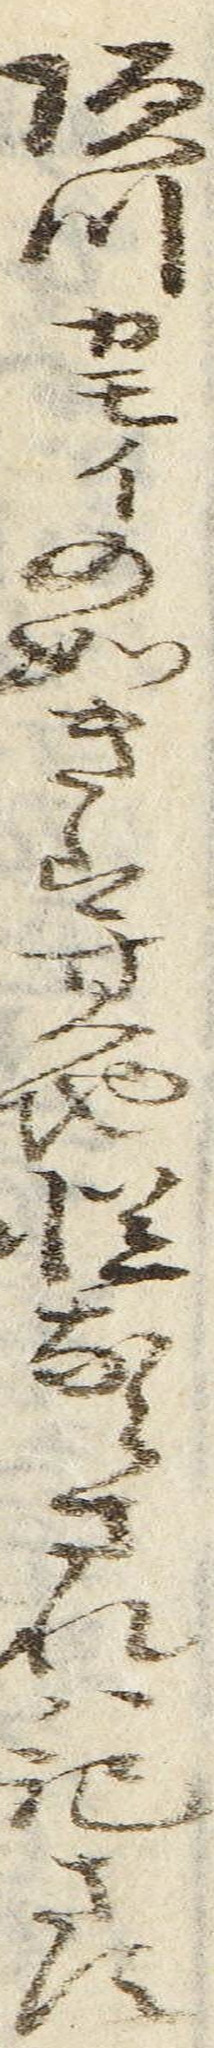頂川カモイの如きは其地慥ならされは記さす

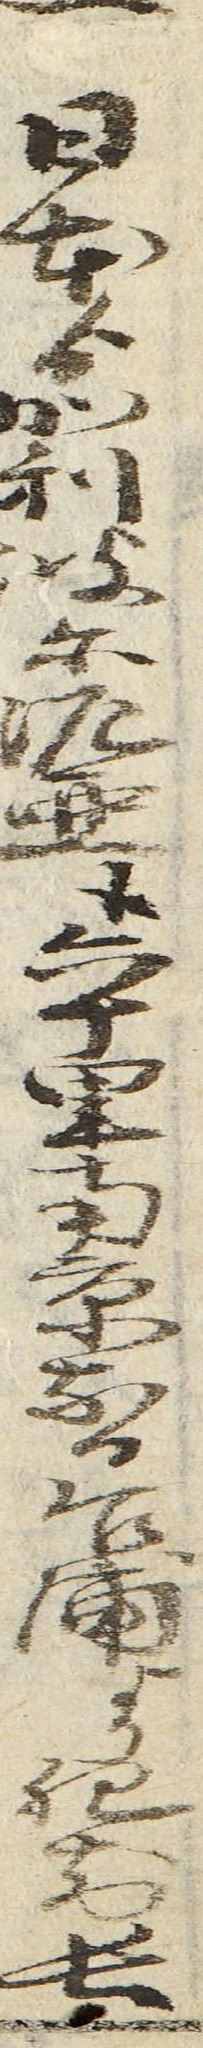一日本ゟ加利波尓泥亜江六十里南京なる乍浦より肥前長
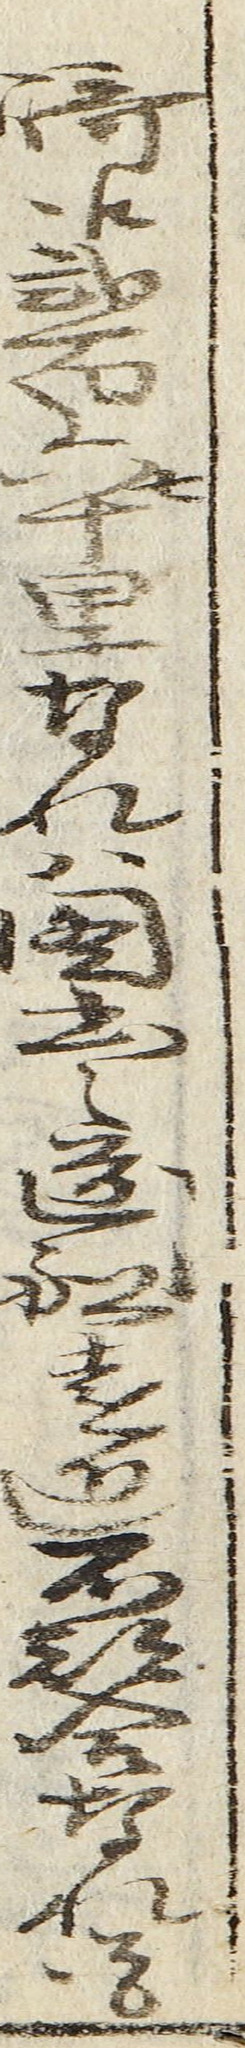崎江弐百六十里なれは図書之道船遠近不都合なれとも
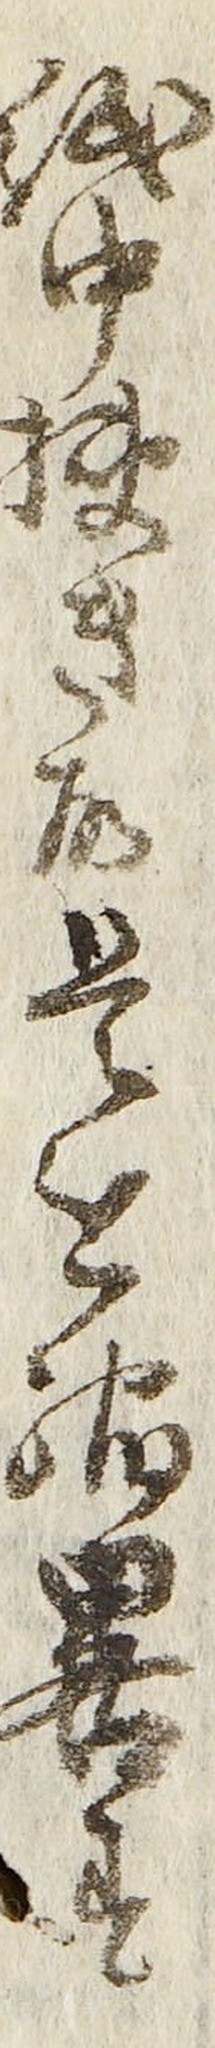紙中狭き故是を縮略す
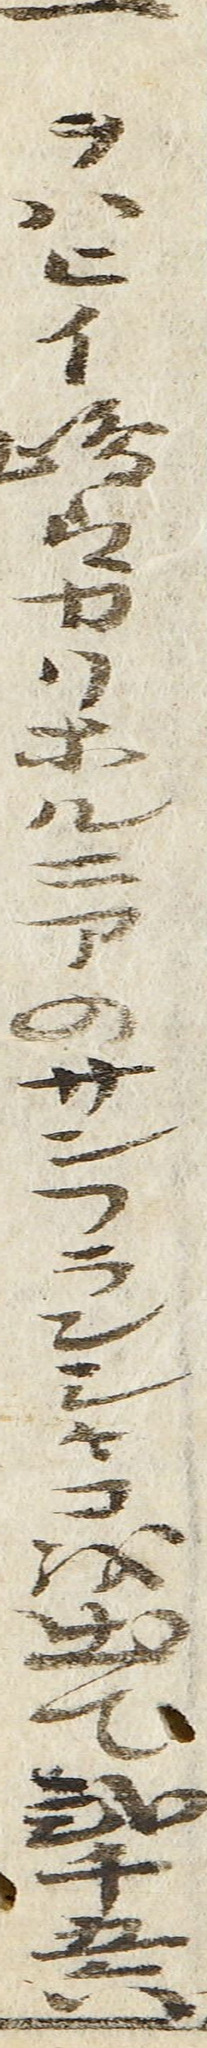一ヲハヒイ島はカリホルニアのサンフランシャコを出て弐千五六
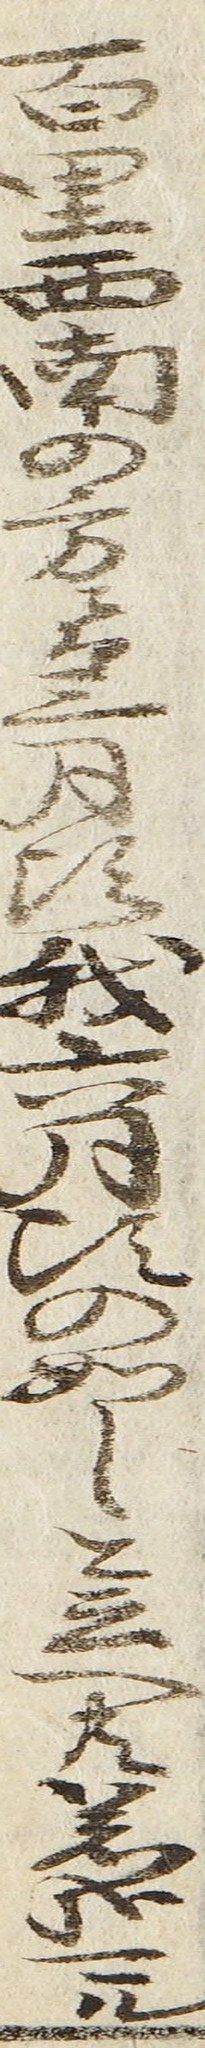百里西南の方に而三月頃我六月頃の如しと云へ共若哉マル
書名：漂流夢物語
